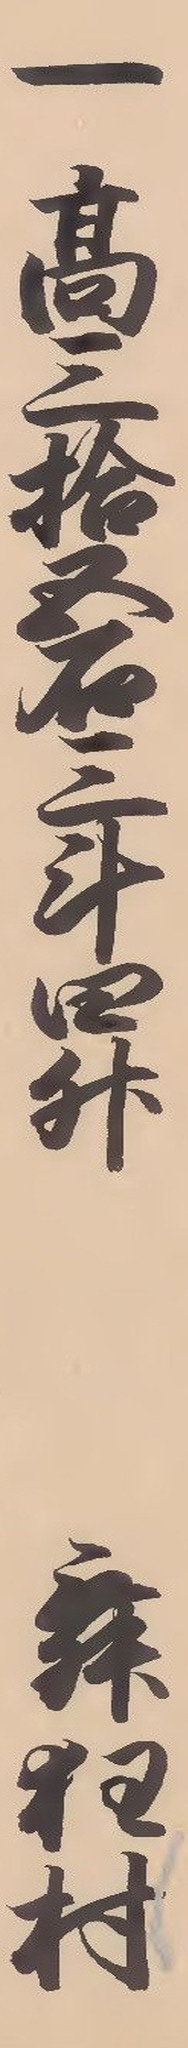一高三拾五石三斗四升舞狂村
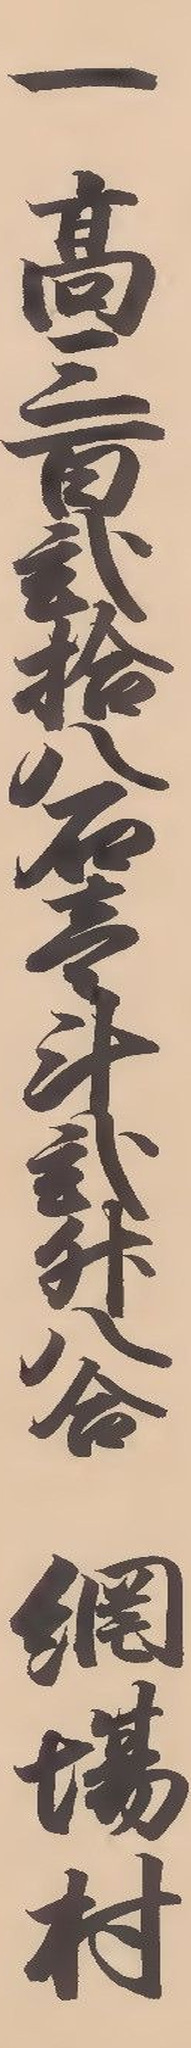一高三百弐拾八石壱斗弐升八合網場村
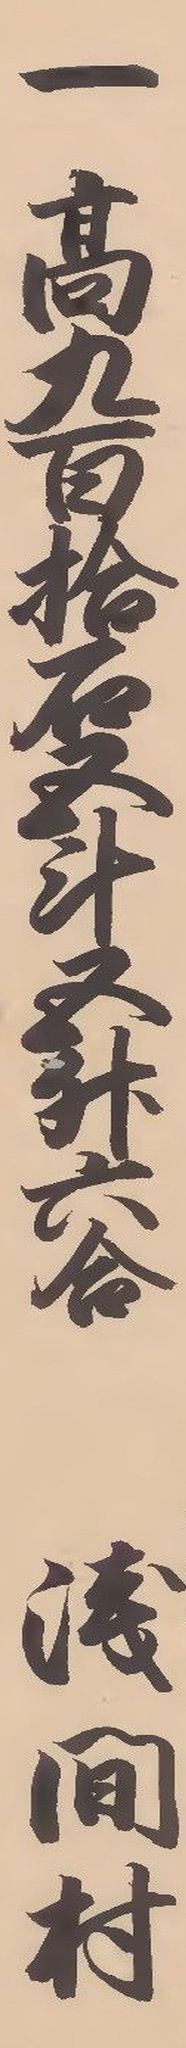一高九百拾石五斗五升六合浅間村

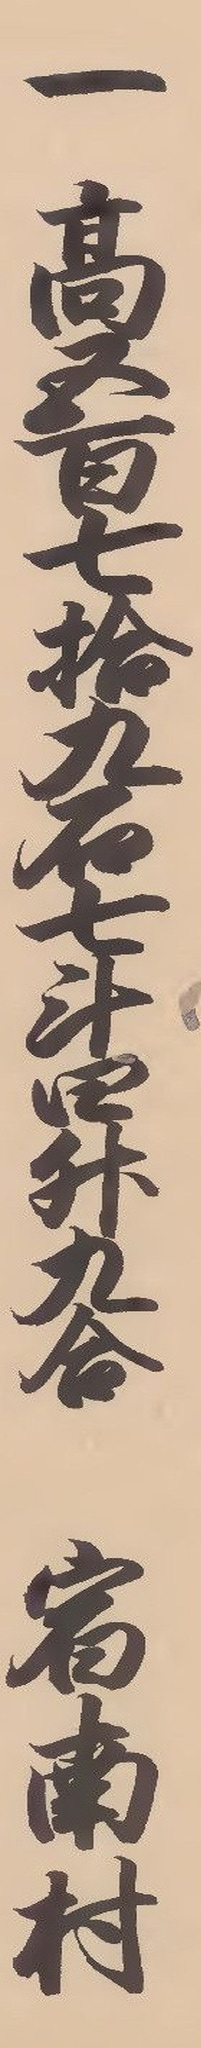一高五百七拾九石七斗四升九合宿南村
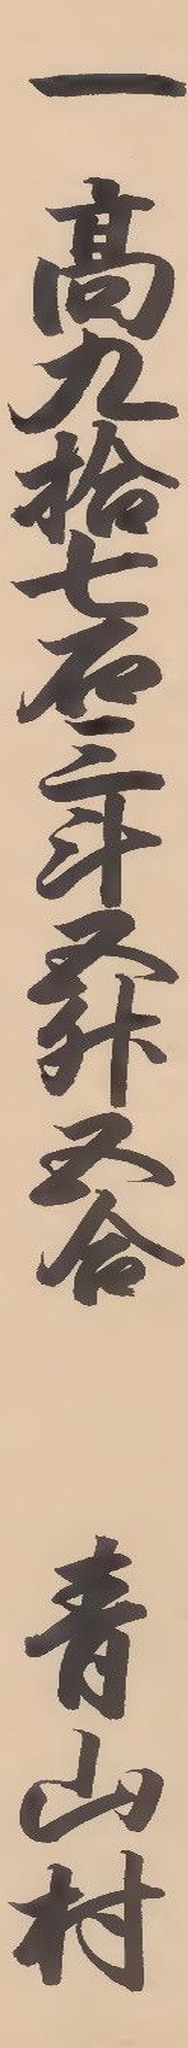一高九拾七石三斗五升五合青山村
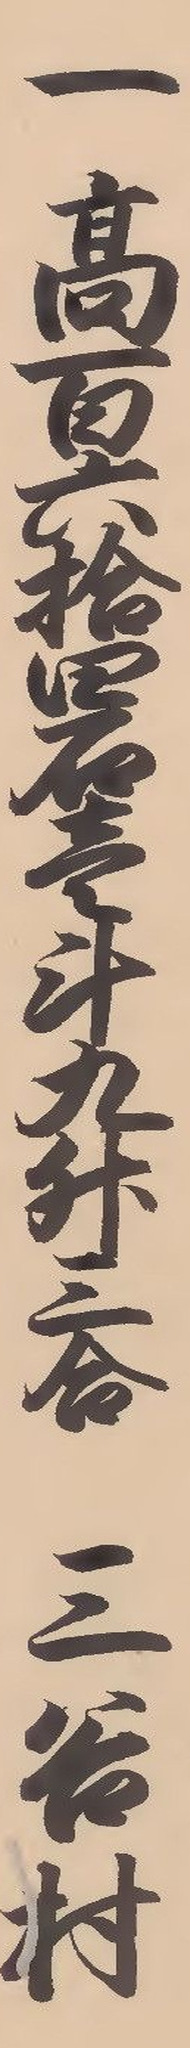一高百六拾四石壱斗九升三合三谷村
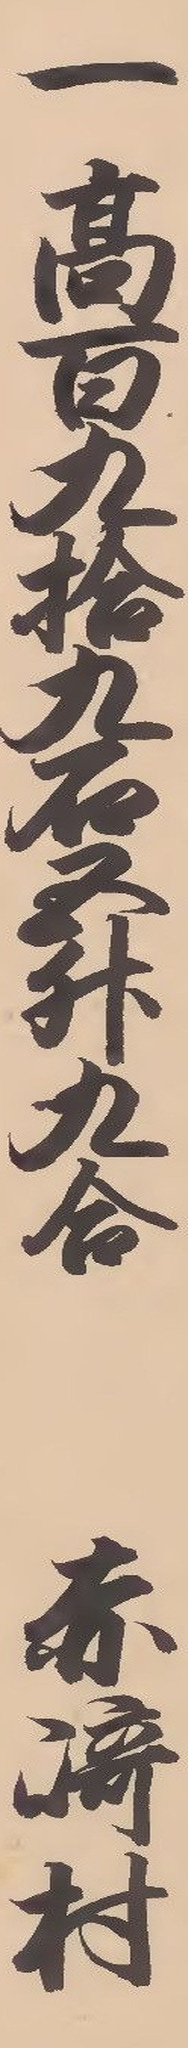一高百九拾九石五升九合赤崎村
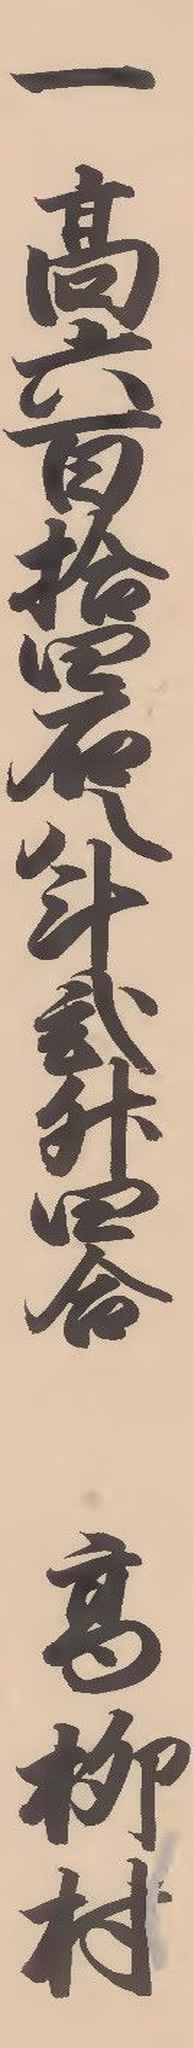一高六百拾四石八斗弐升四合高柳村
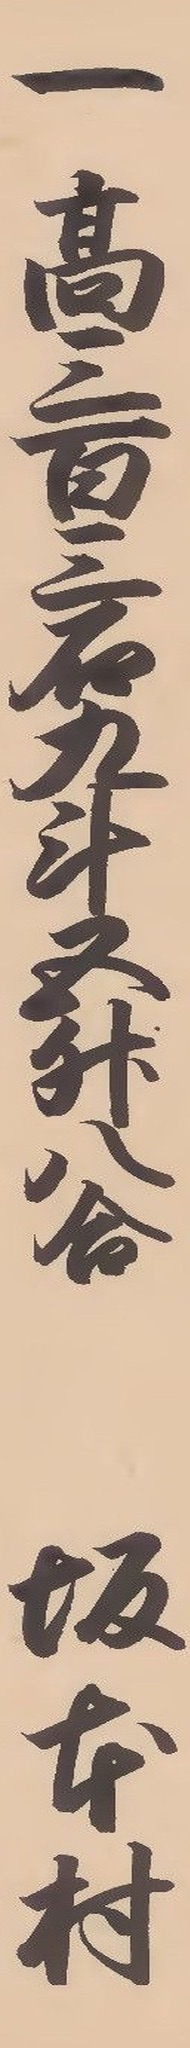一高三百三石九斗五升八合坂本村
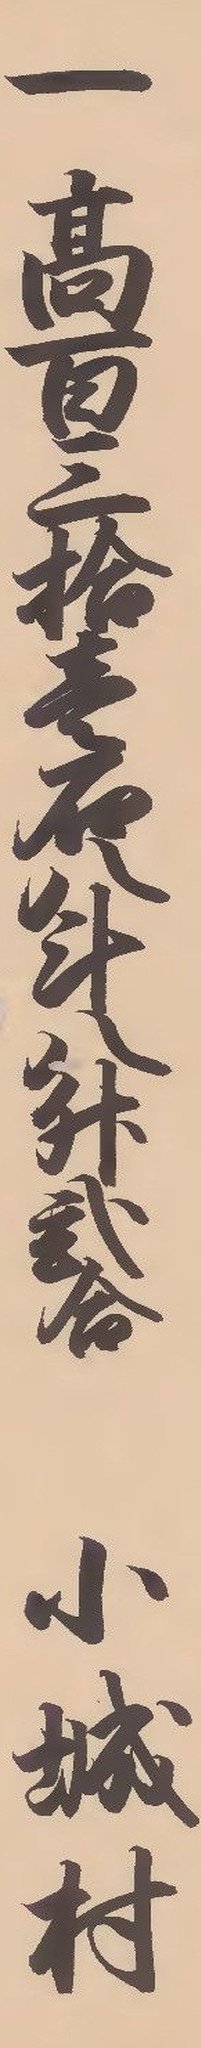一高百三拾壱石八斗八升弐合小城村

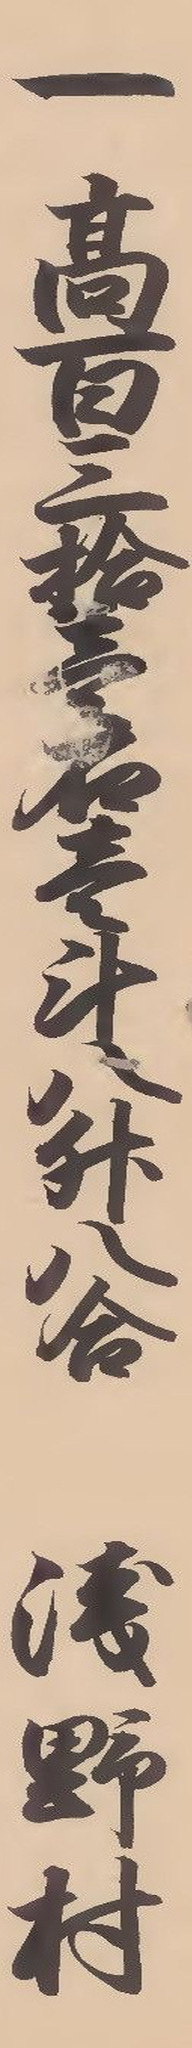一高百三拾壱石壱斗八升八合浅野村
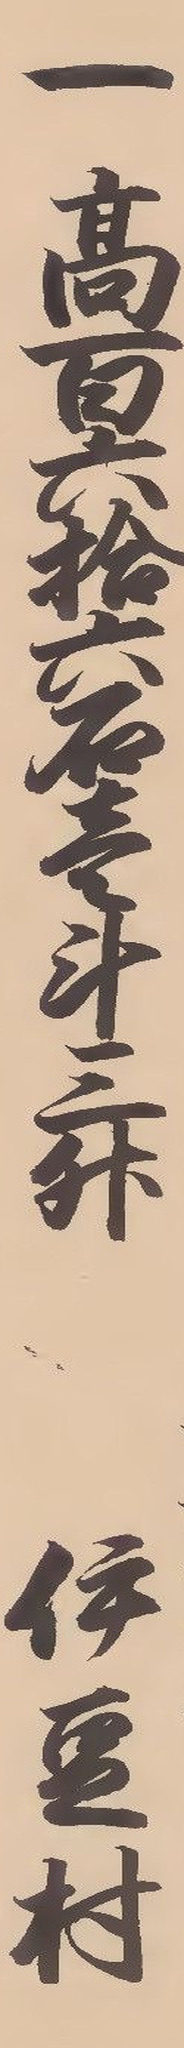一高百六拾六石壱斗三升伊豆村
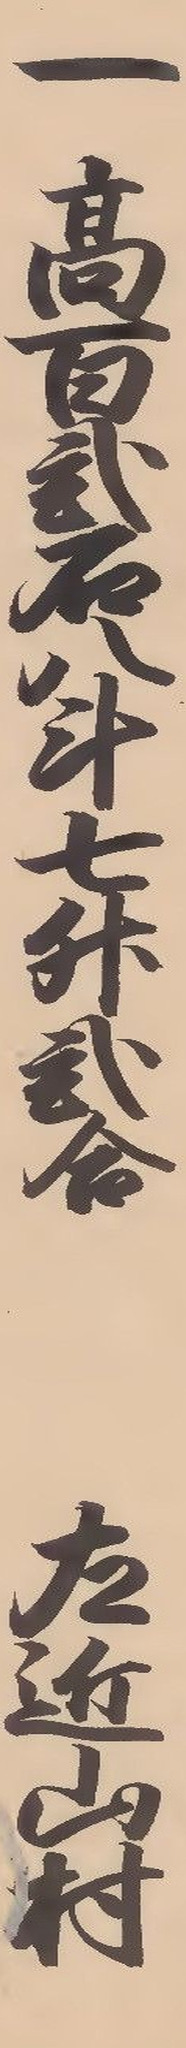一高百弐石八斗七升弐合左近山村
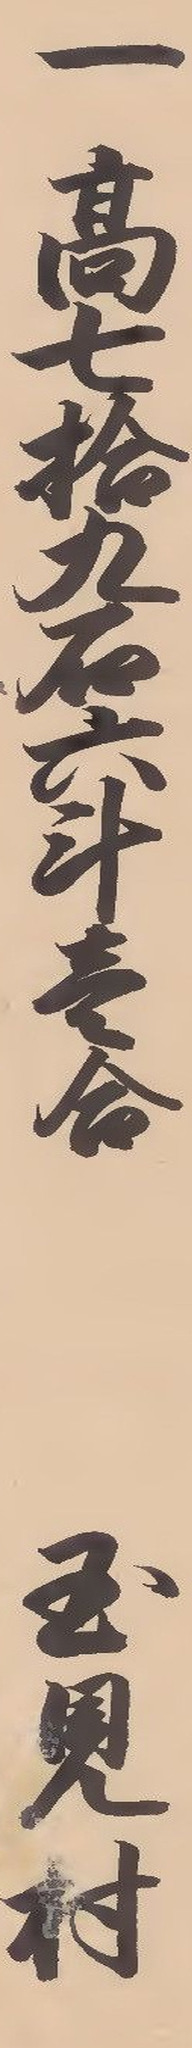一高七拾九石六斗壱合玉見村
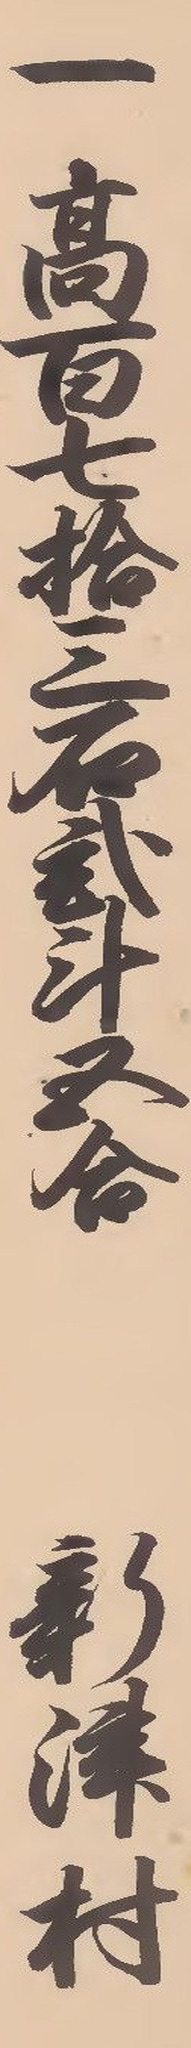一高百七拾三石弐斗五合新津村
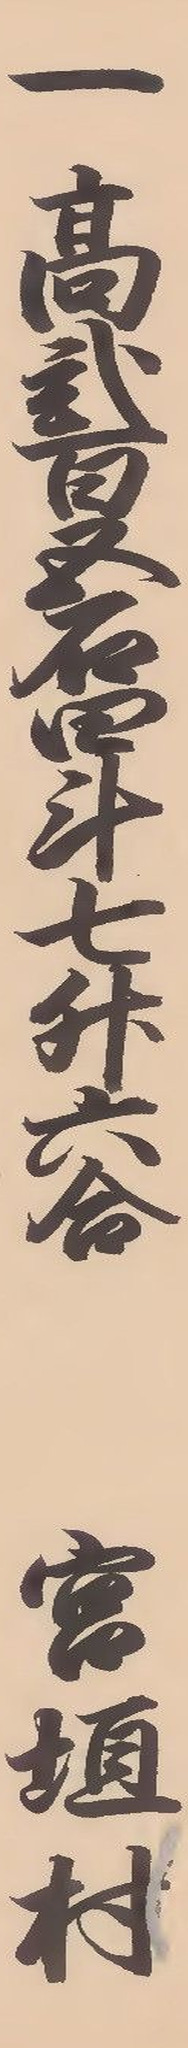一高弐百五石四斗七升六合宮垣村
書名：但馬国郷帳
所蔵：国立公文書館 National Archives of Japan
